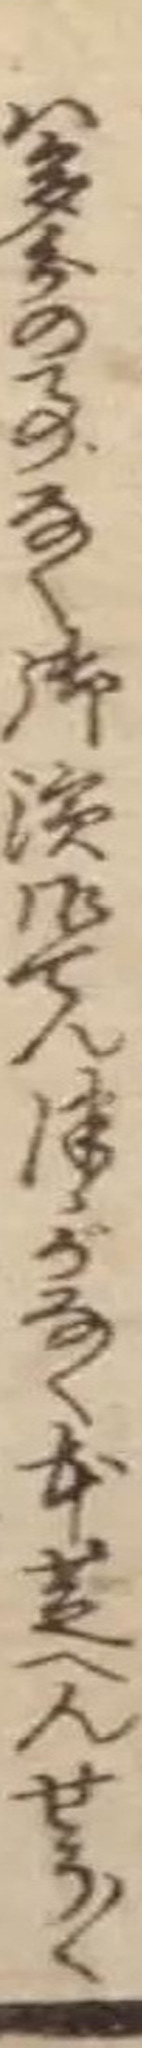は多分の事なく御浜ごてんつつがなく本芝へんせう〳〵
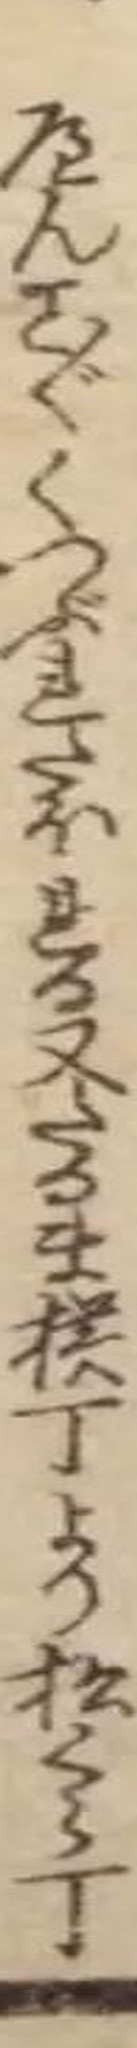へん事〴〵くつぶれたほれる又だるま横丁より松くら丁
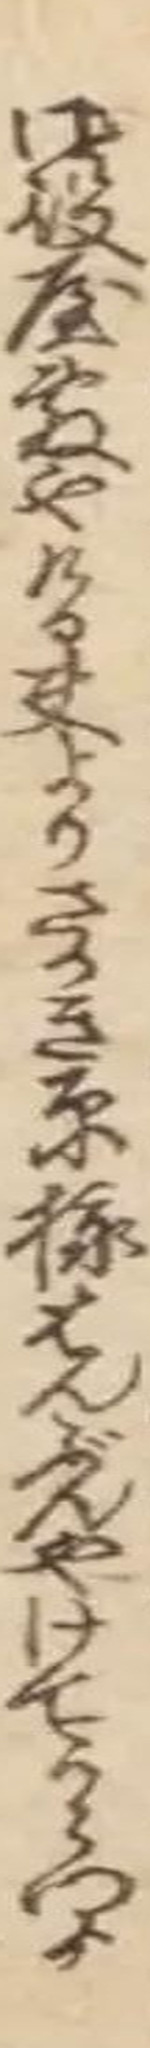御役屋敷やける夫よりさかき原様はんぶんやけてうら門より
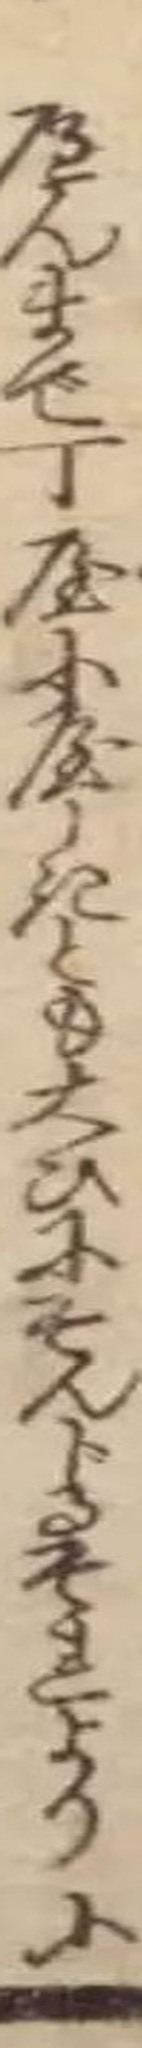へんまで丁屋小屋しきとも大ひにそんじるそれより小
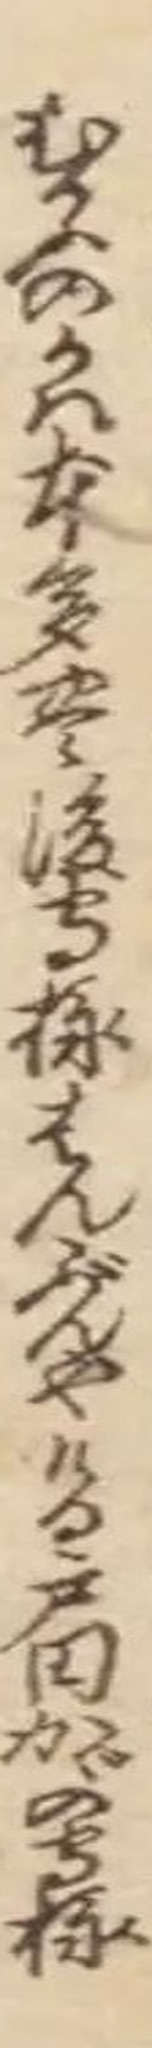むかふのかは本多豊後守様はんぶんやける戸田かゞの守様
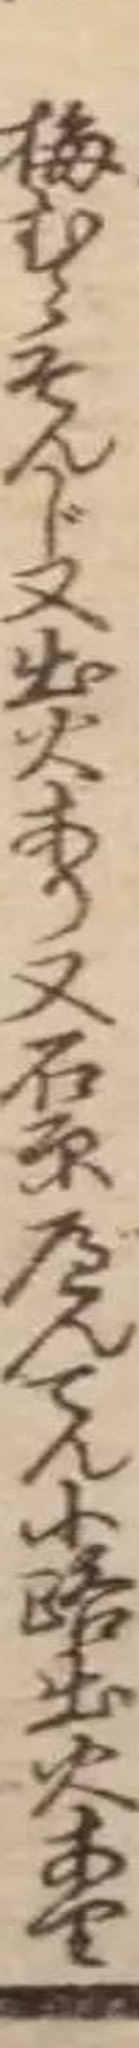梅むらそんじ又出火あり又石原べんてん小路出火あり
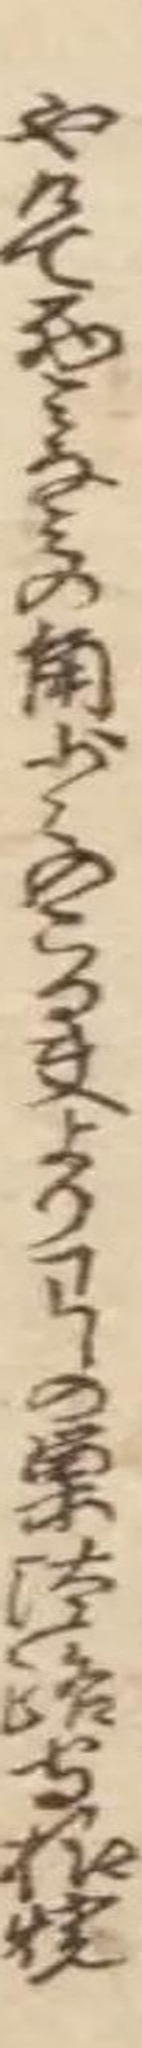やけて西みなみの角少〃のこる夫よりわしの巣淡路守様焼
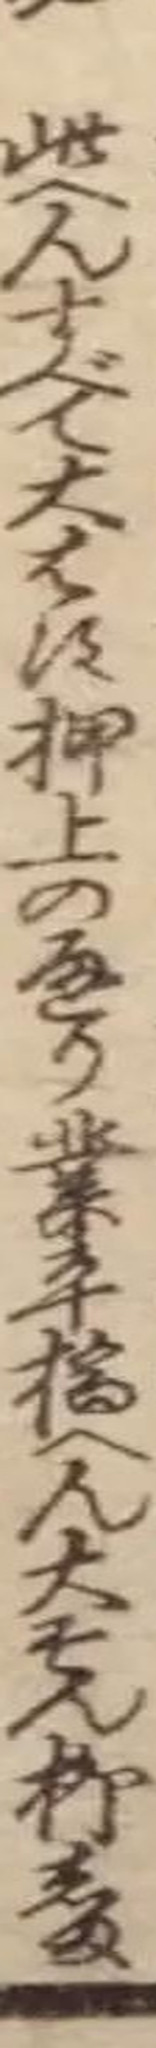此へんすべて大は須押上の辺り業平橋へん大そん柳しま
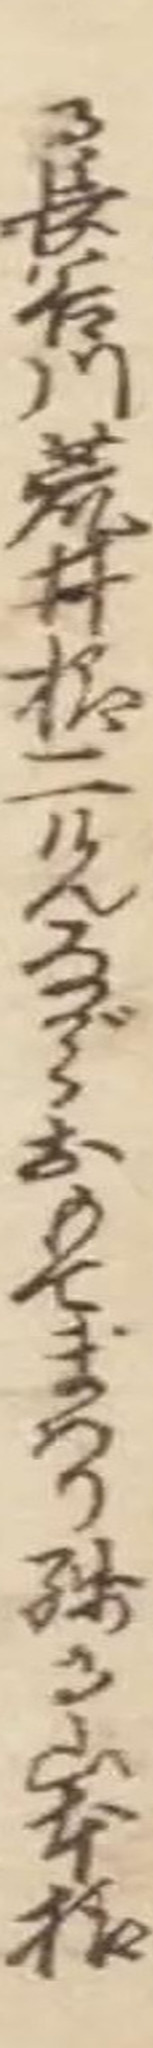る長谷川荒井様二けんながらおもてまはり残る山本様
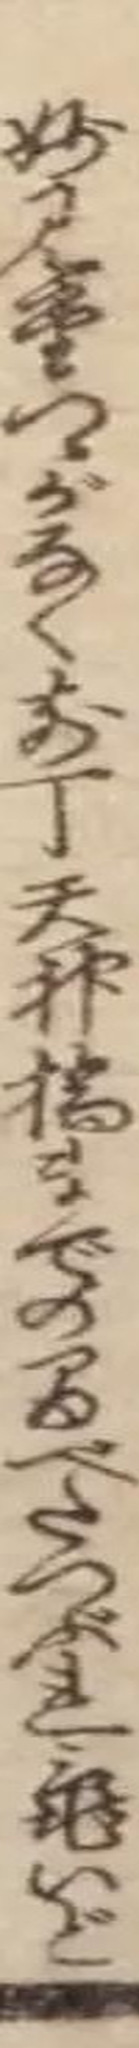妙見堂つゝがなく前町天神橋までの間べたつぶれ亀いど
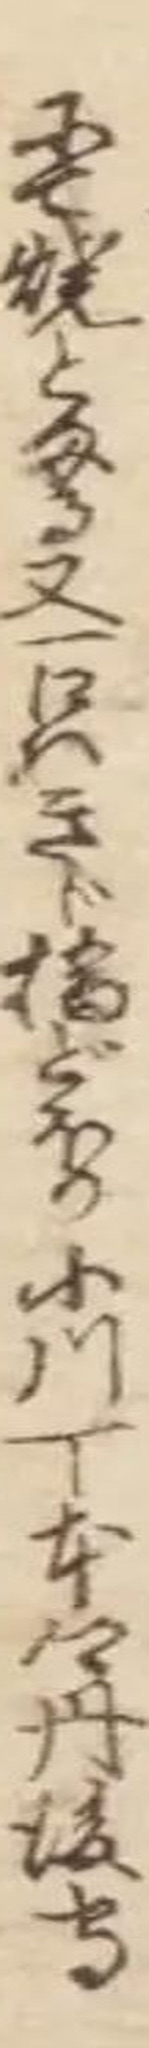にて焼とまる又一口はきじ橋どほり小川丁本郷丹後守
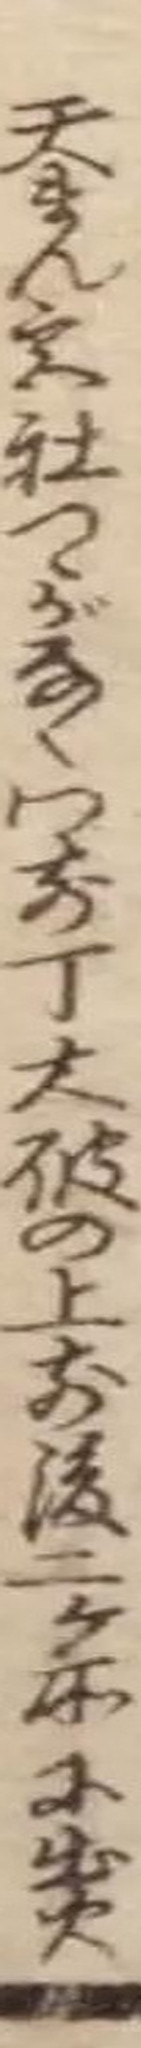天まん宮社つゝがなく門前町大破の上前後二ヶ所に出火
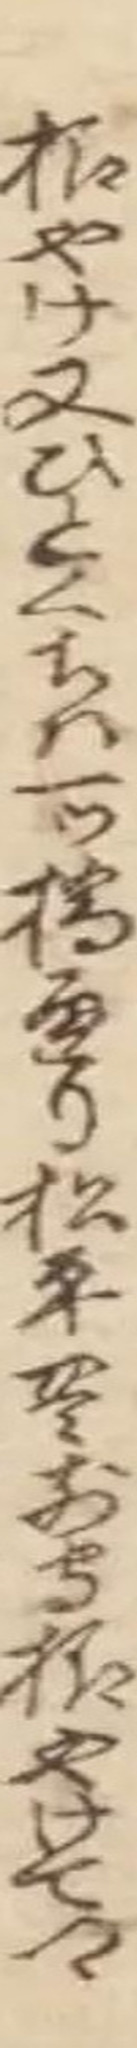様やけ又ひとくちは一ツ橋通り松平豊前守様やけてつ
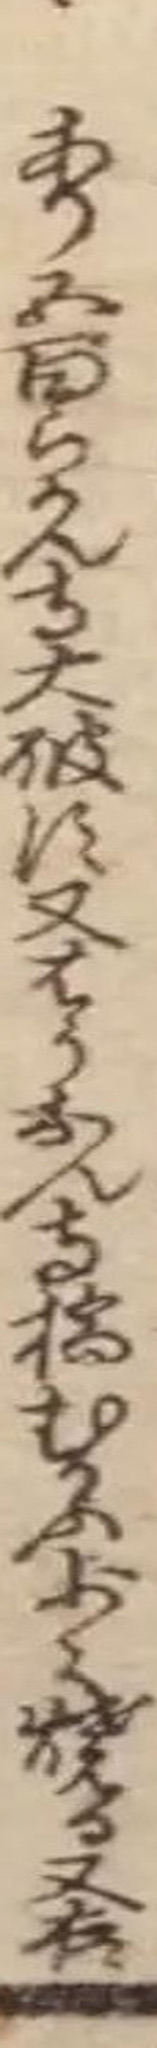あり五百らかん寺大破す又はうおん寺橋むかふ少々焼る又吉
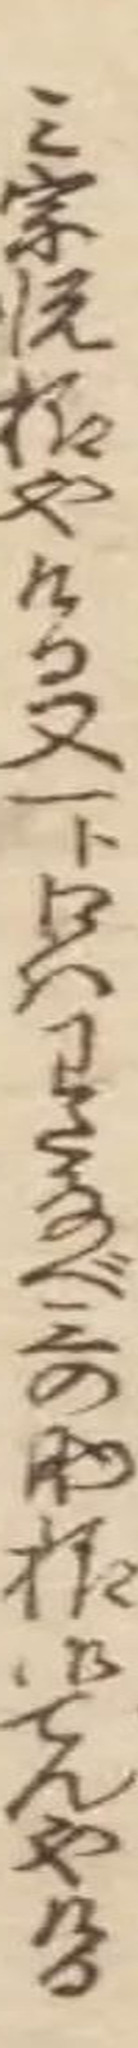み宗悦様やける又一ト口はわたなべ三之助様御てんやける
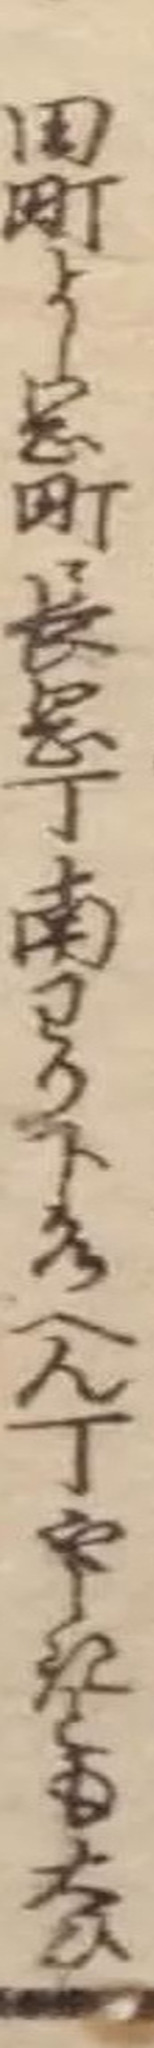田町よし岡町長岡丁南わり下道へん丁やしきとも大ひ
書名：関東大地震末代鑑
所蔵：国立国会図書館 National Diet Library, JAPAN
